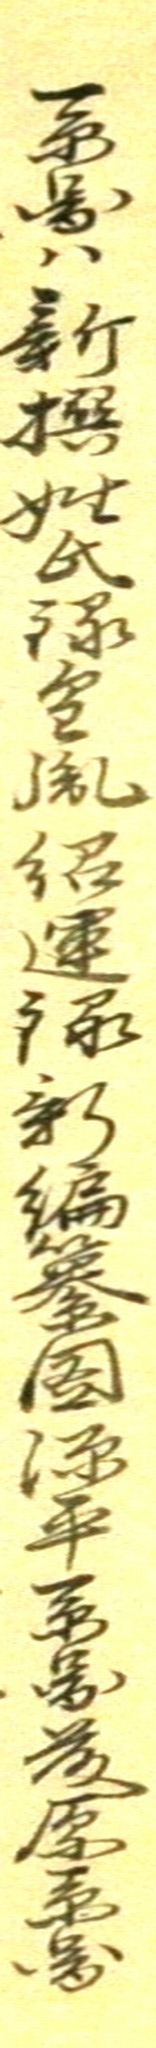系図は新撰姓氏録皇胤紹運録新編纂図源平系図藤原系図
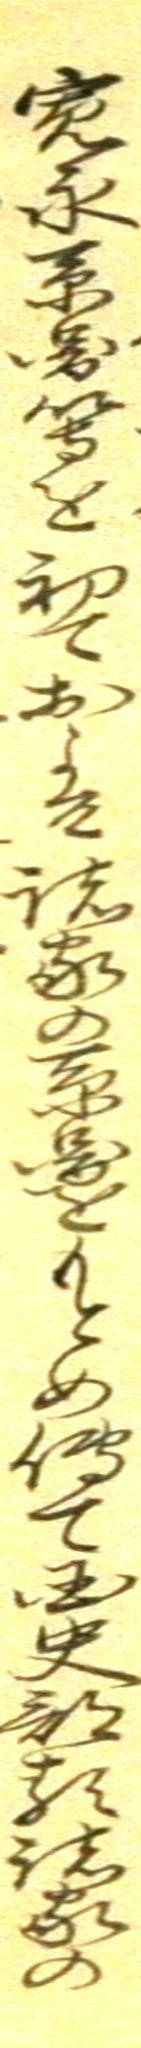寛永系図等を初ておよそ諸家の系図をもとめ伝て国史部類諸家の
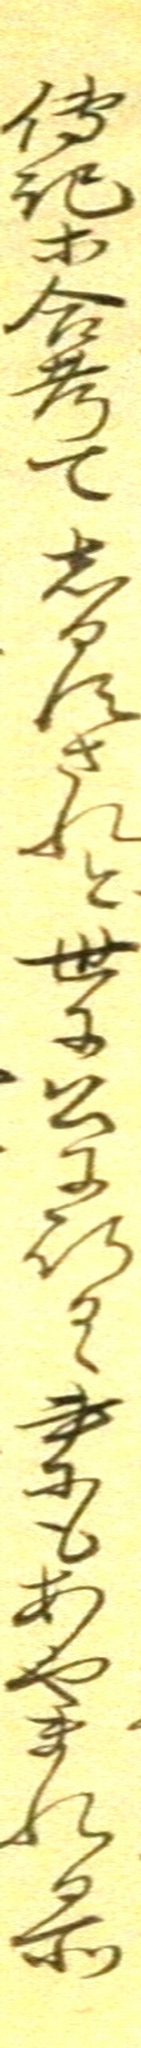伝記等合考てしるすされと世に公に行るゝ事にもあやまれる所
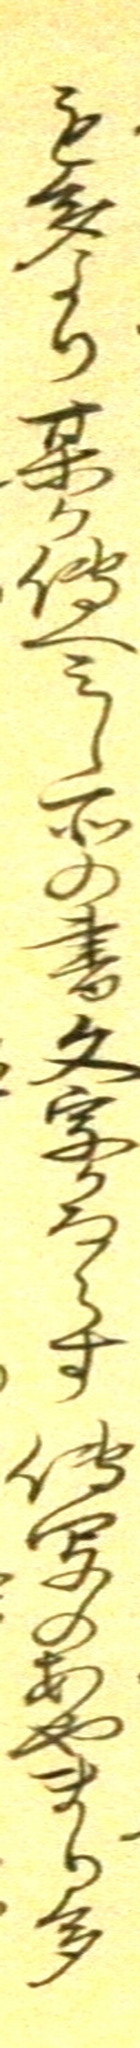も多より某か伝へみし所の書文字かならす伝写のあやまり多
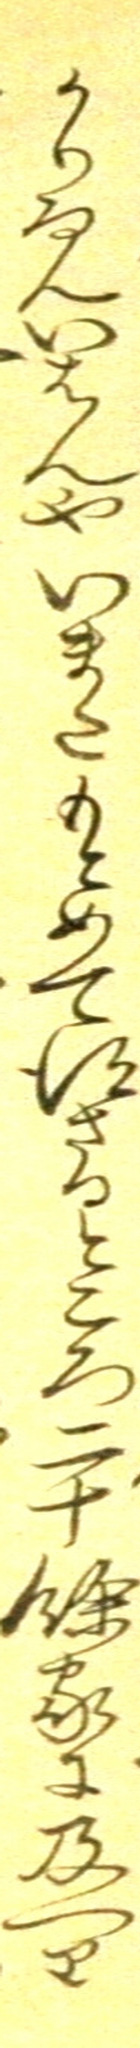かりなんいはんやいまたもとめて得さるところ二十余家に及へり
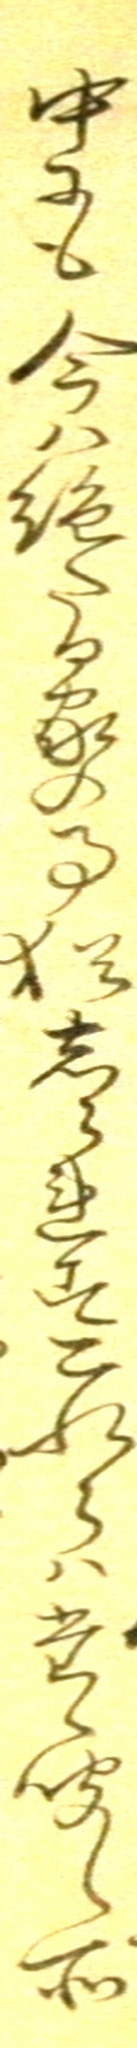中にも今は絶たる家の事猶しられすこれらはたゝ聞し所
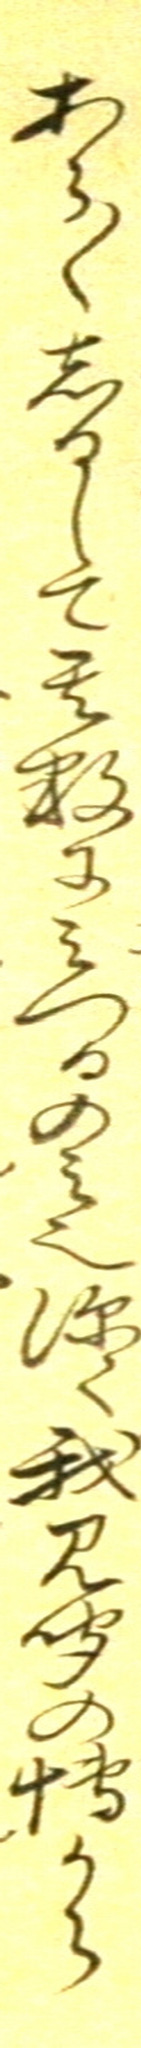あら〳〵しるして其数にみつるのみ也深く我見聞の博から
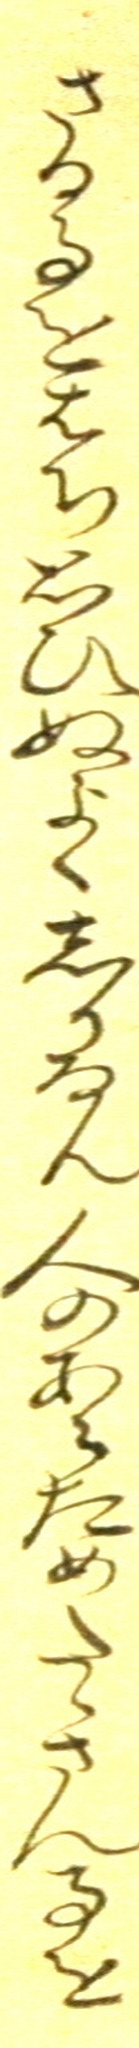さる事をはち思ひぬよくしりなん人のあらためたゝさん事を

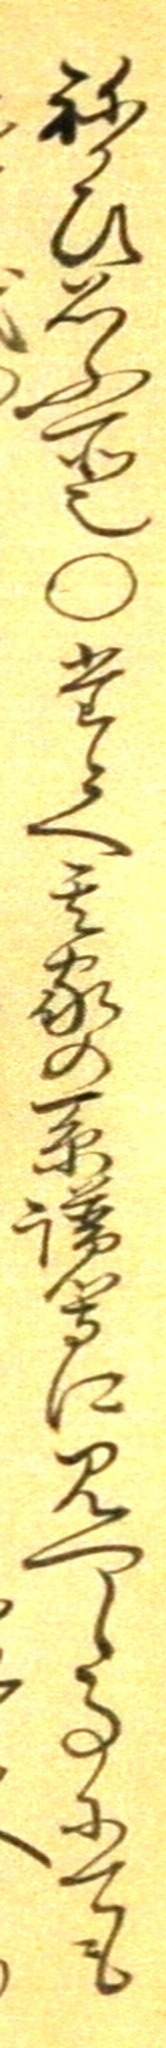ねがひ思ふ所也○たとへ其家の系譜等に見へし事にても
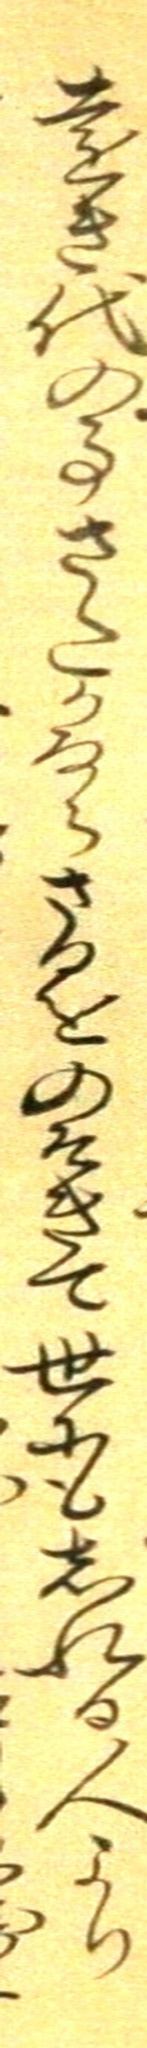遠き代の事さたかならさるをのそきて世にもしれる人より
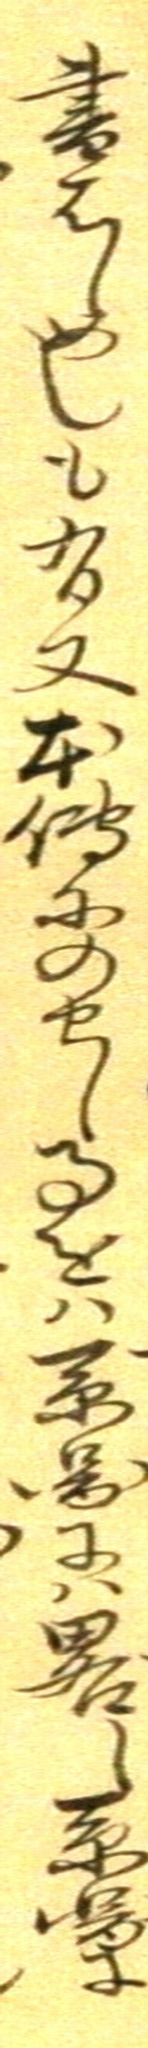書はしめしも有又本伝にのせし事をは系図には略し系図に
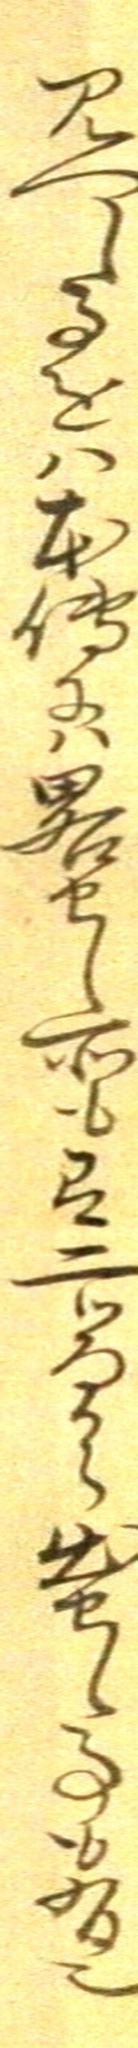見へし事をは本伝には略せし所も有二ッなから出せし事も有也
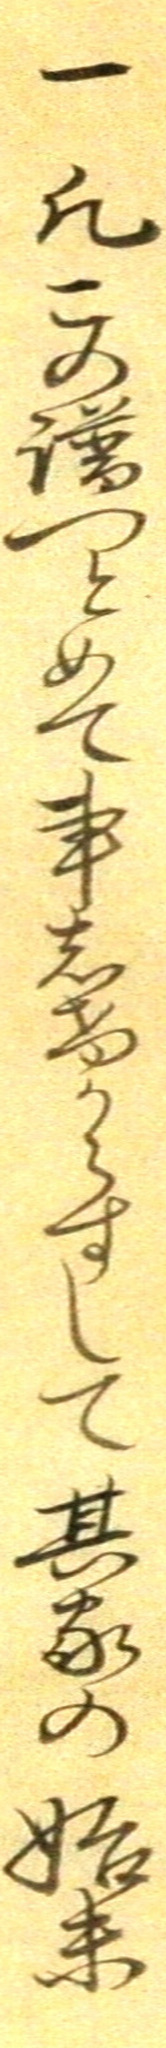一凡この譜つとめて事しけからすして其家の始末
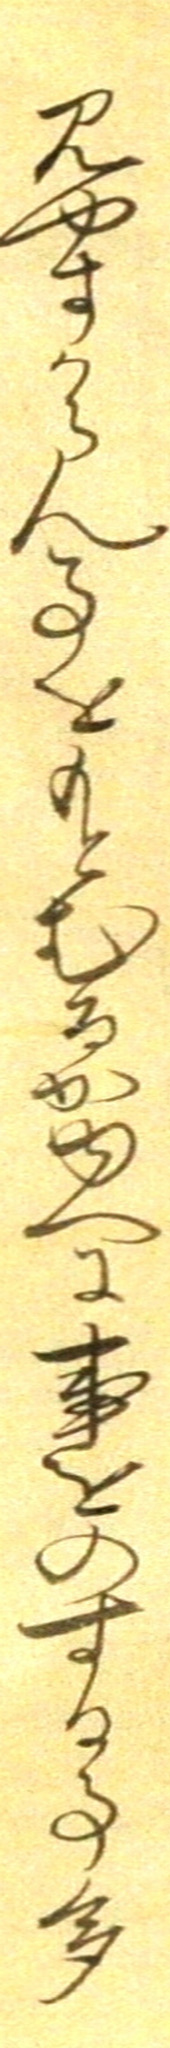見やすからん事をもとむるかゆへに事をのする事多
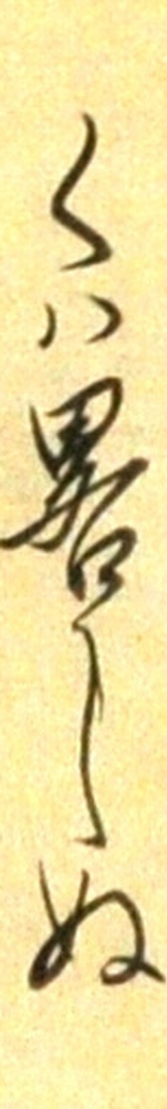くは略しぬ
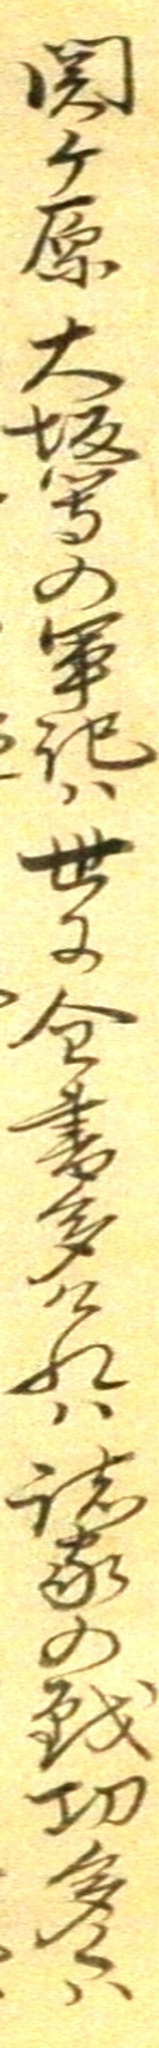関ヶ原大坂等の軍記は世に全書多けれは諸家の戦功多くは
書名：藩翰譜（一）
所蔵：伊那市立高遠町図書館・合同会社AMANE
